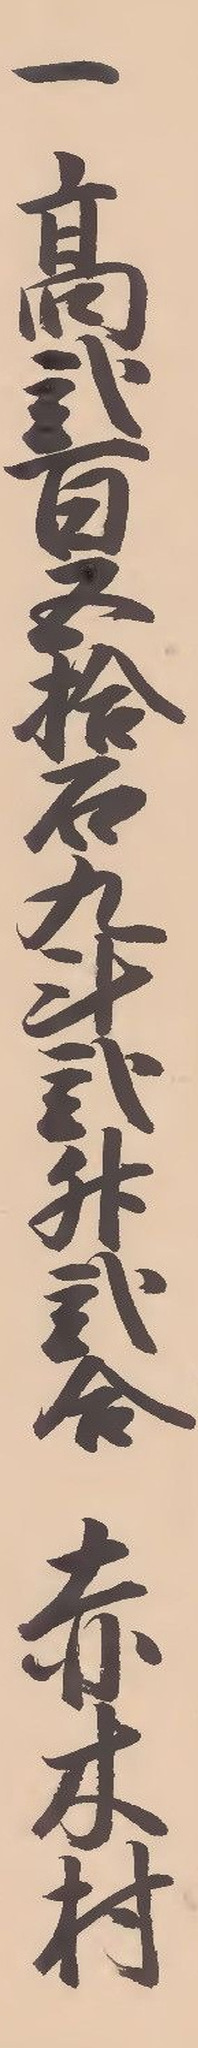一高弐百五拾石九斗弐升弐合赤木村

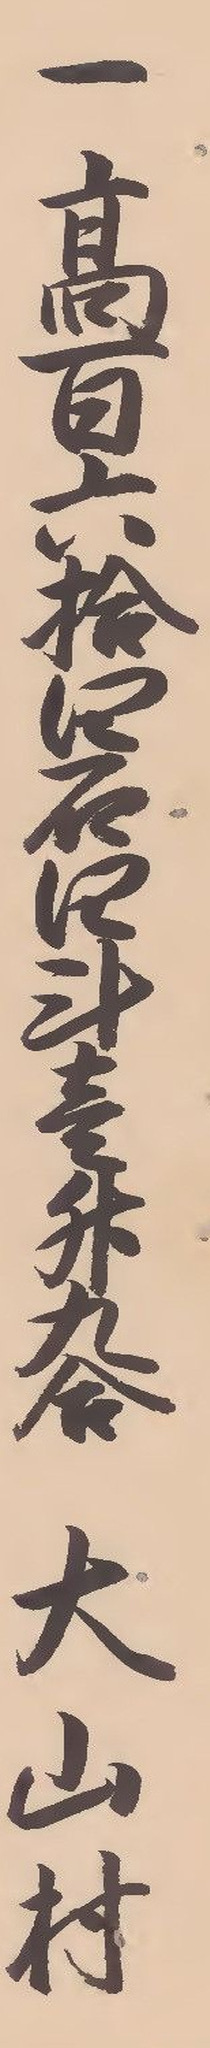一高百六拾四石四斗壱升九合大山村
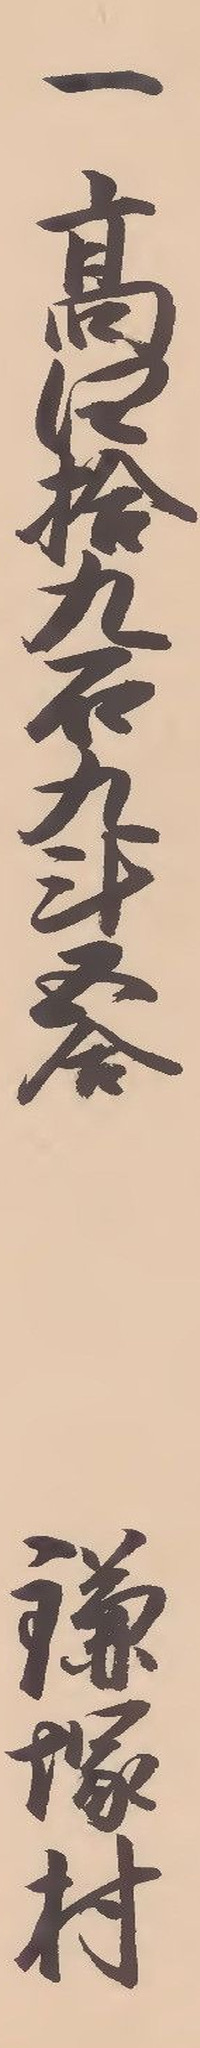一高四拾九石九斗五合鎌塚村
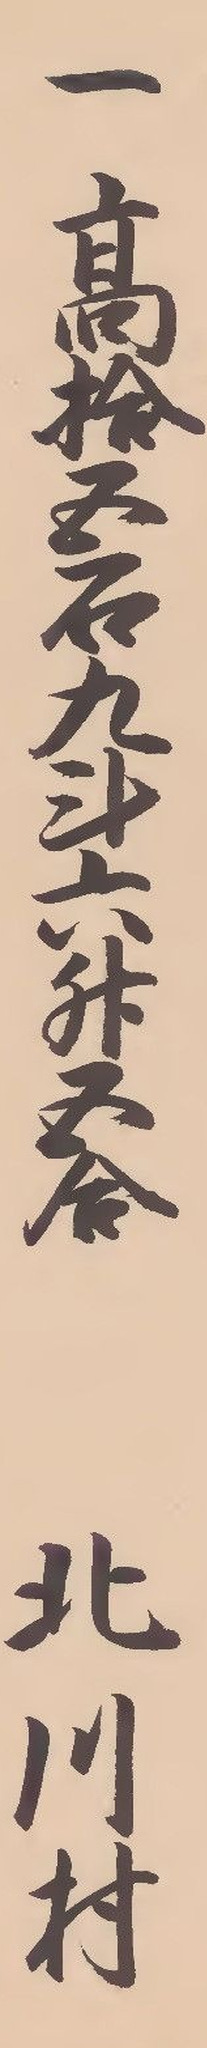一高拾五石九斗六升五合北川村
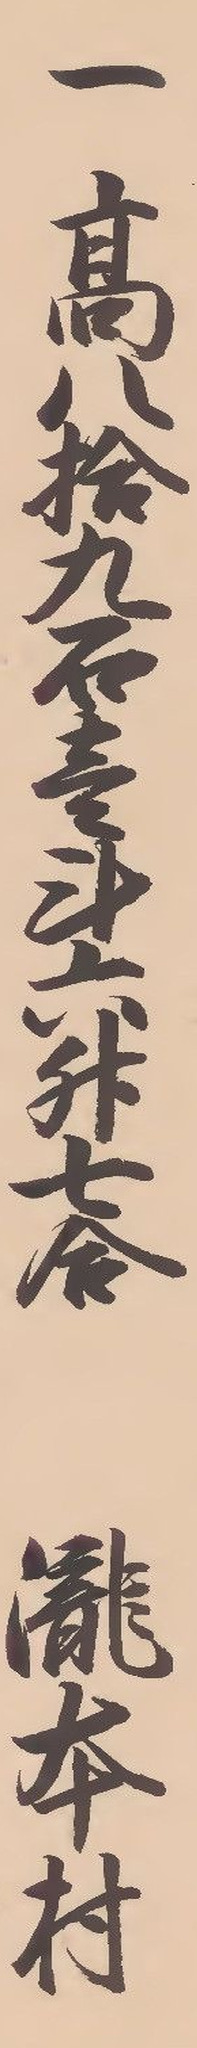一高八拾九石壱斗六升七合滝本村
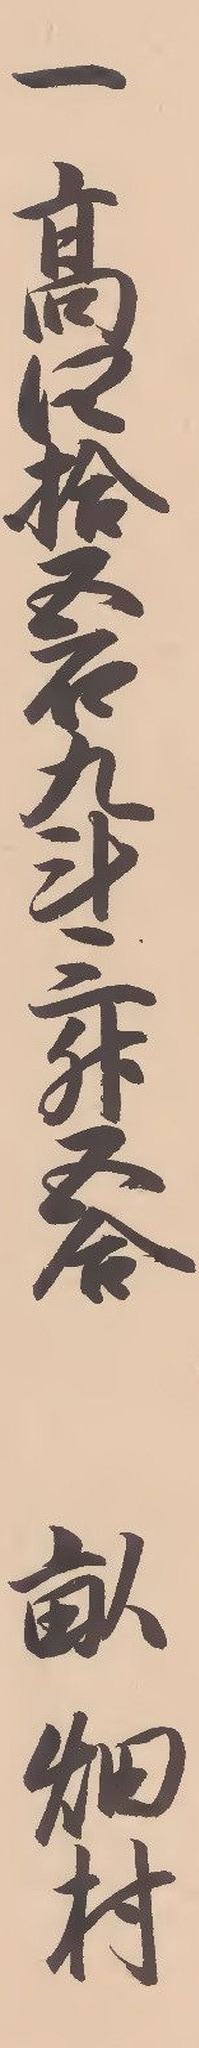一高四拾五石九斗三升五合畝畑村
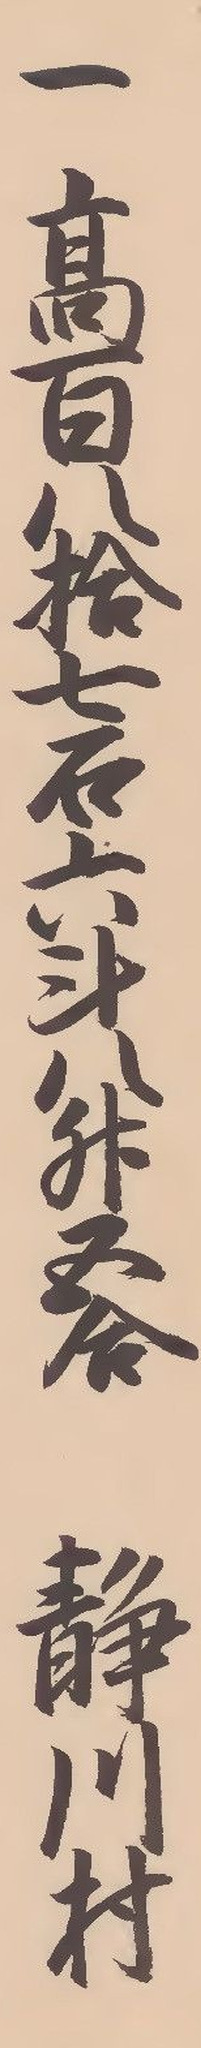一高百八拾七石六斗八升五合静川村
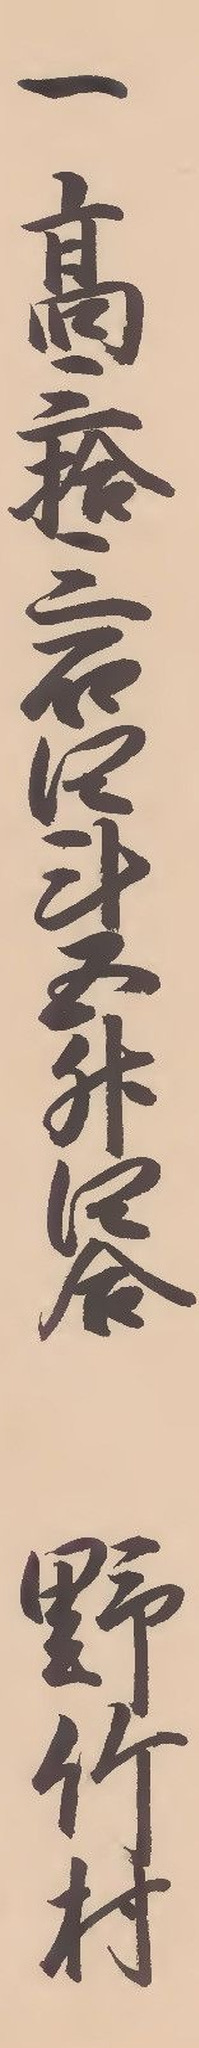一高三拾三石四斗五升四合野竹村
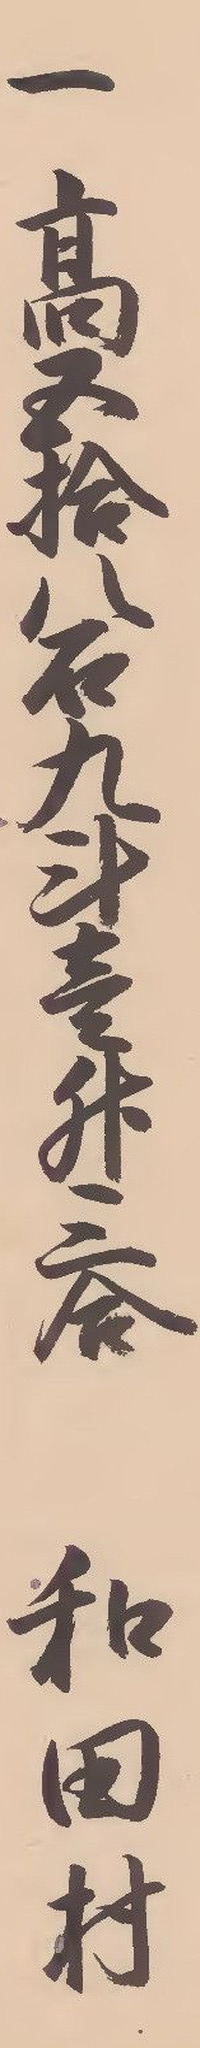一高五拾八石九斗壱升三合和田村

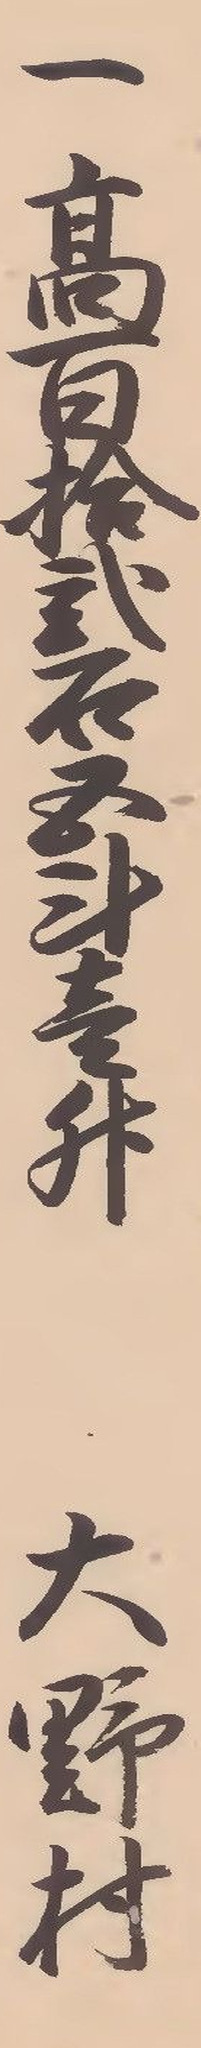一高百拾弐石五斗壱升大野村
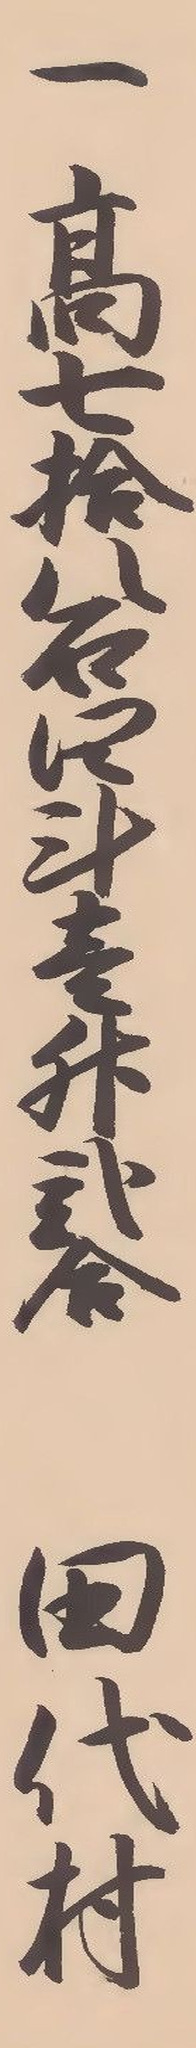一高七拾八石四斗壱升弐合田代村
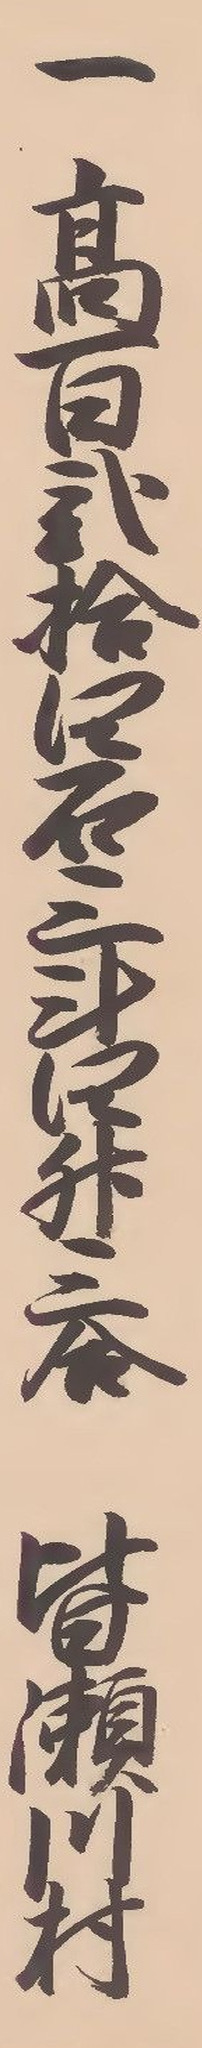一高百弐拾四石三斗四升三合皆瀬川村
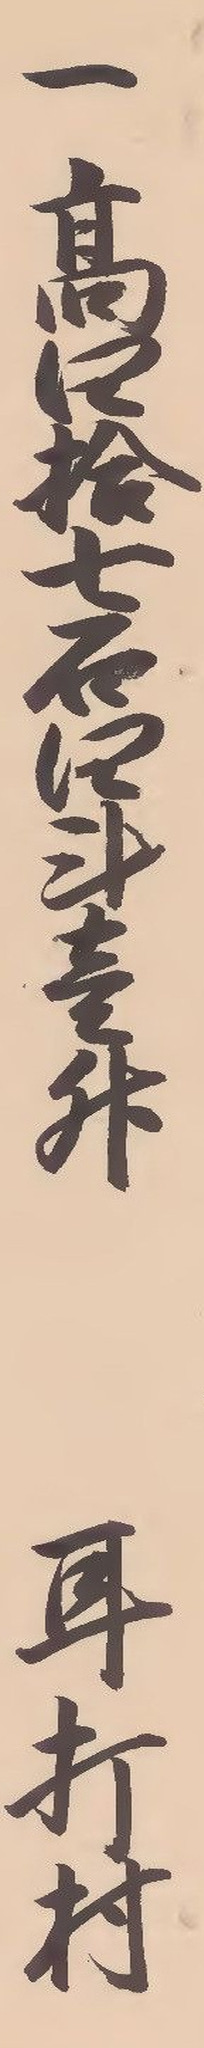一高四拾七石四斗壱升耳打村
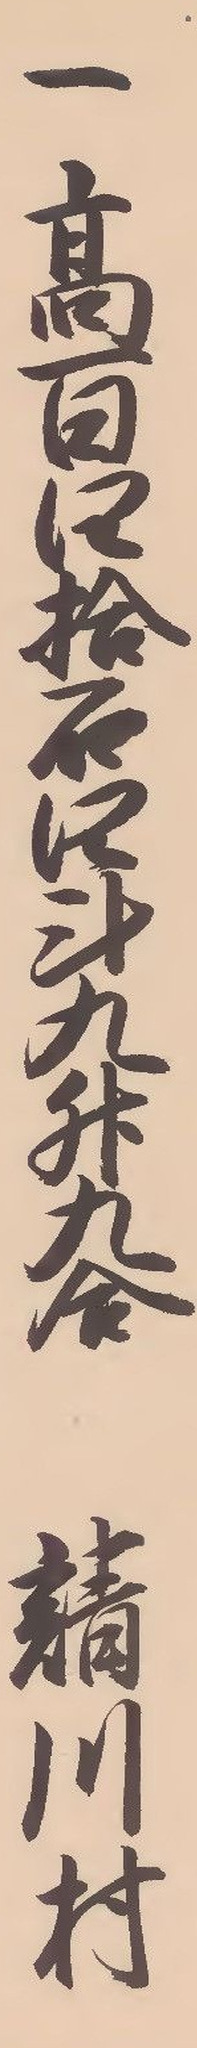一高百四拾石四斗九升九合請川村
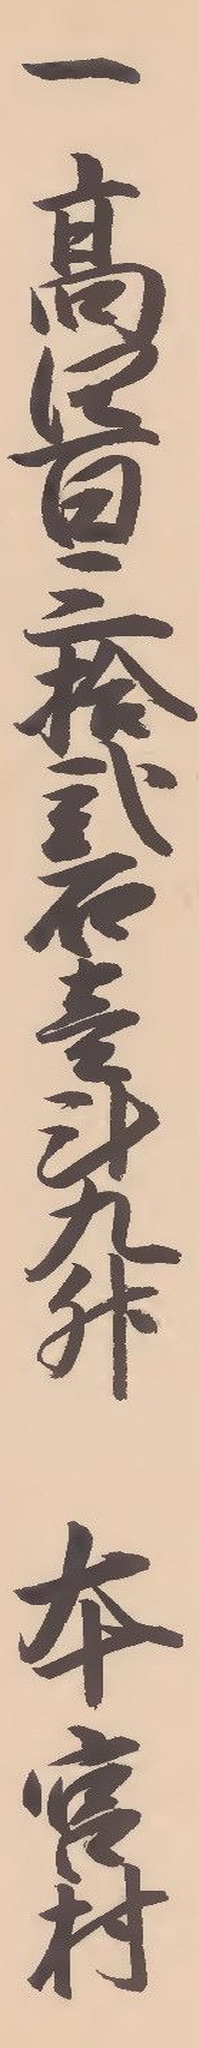一高四百三拾弐石壱斗九升本宮村
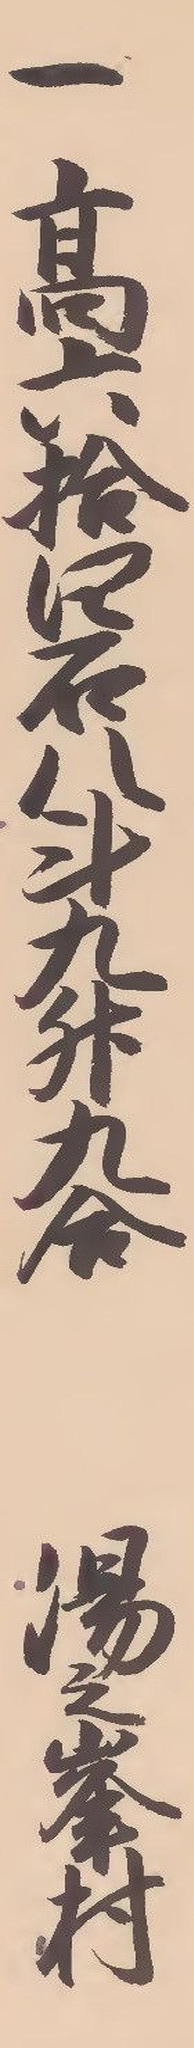一高六拾四石八斗九升九合湯之峰村
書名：紀伊国郷帳
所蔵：国立公文書館 National Archives of Japan
